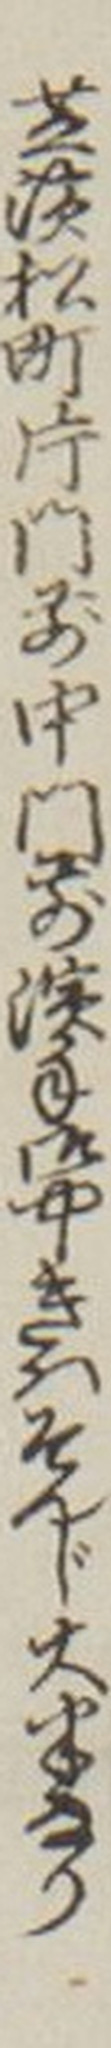芝浜松町片門前中門前浜手御やしきはそんじ大半なり
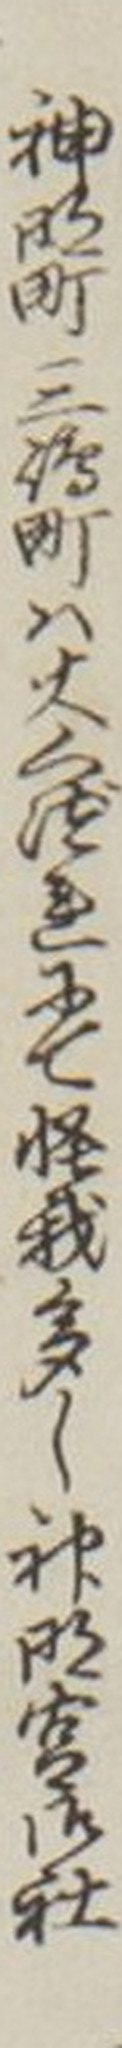神明町三島町は大くづれにて怪我多し神明宮御社
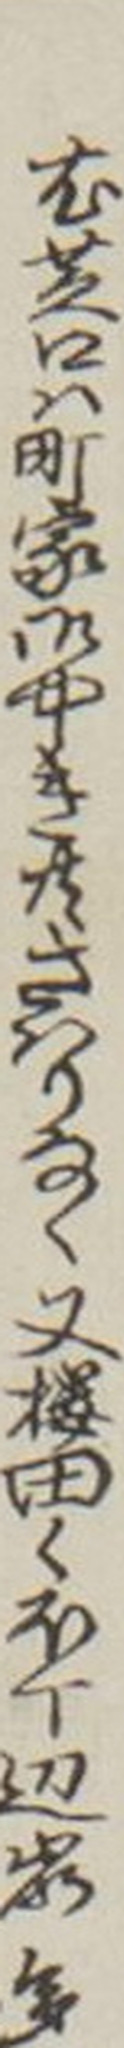尤芝口は町家御やしき共さはりなく又桜田くほ町辺崩多し
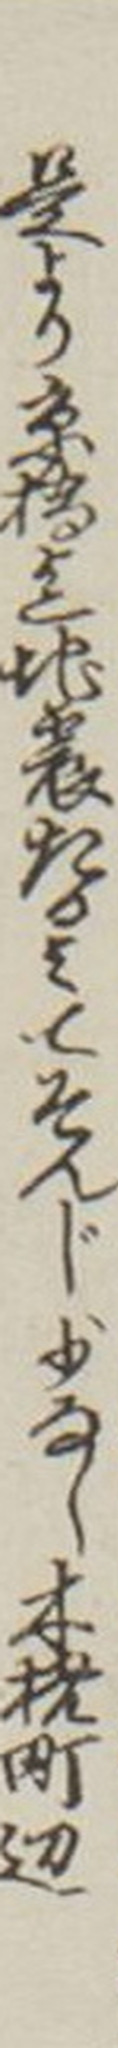是より京橋まで地震たるみてそんじ少なし木挽町辺
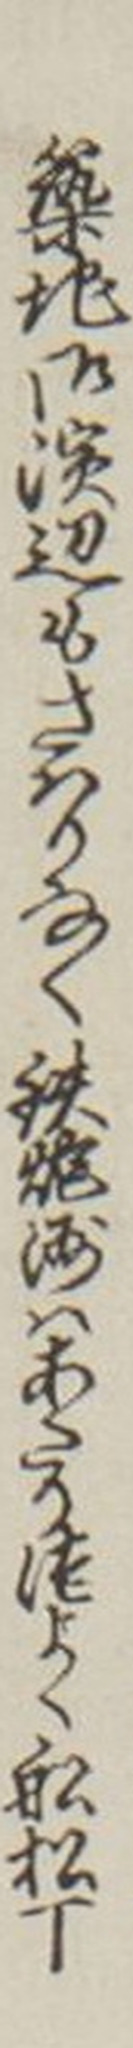築地御浜辺もさはりなく鉄砲州はあたりつよく船松町
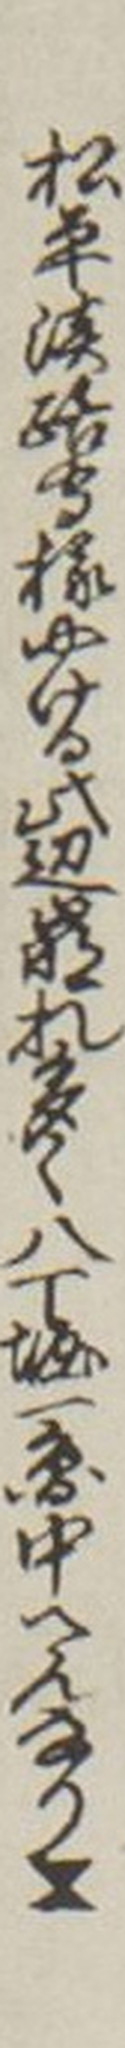松平淡路守様やける此辺崩れ多く八丁堀一円中へんなり▼▲
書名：安政二年十月二日大地震附類焼場所
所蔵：あいおいニッセイ同和損保株式会社
